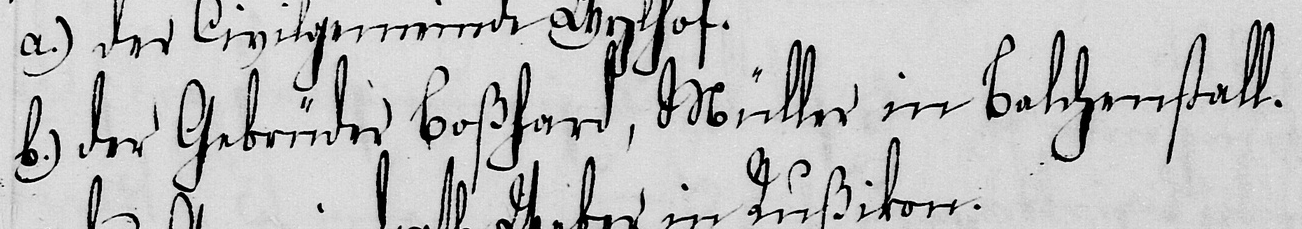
b.) der Gebrüder Boßhard, Müller in Balchenstall.
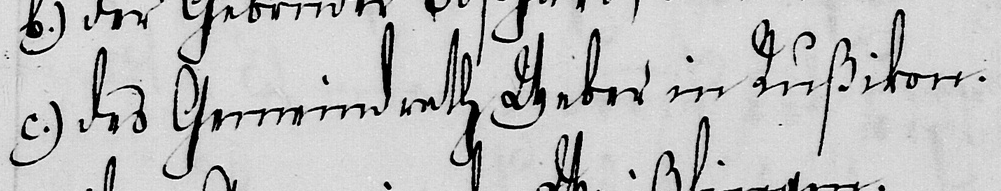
c.) des Gemeindrath Weber in Rußikon.
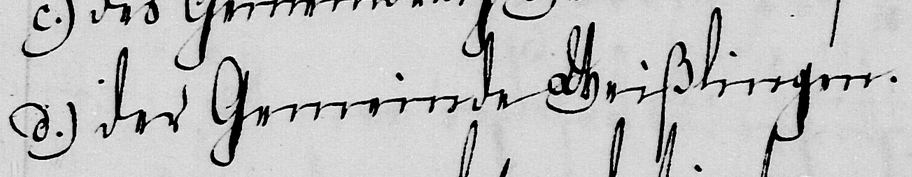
d.) der Gemeinde Weißlingen.
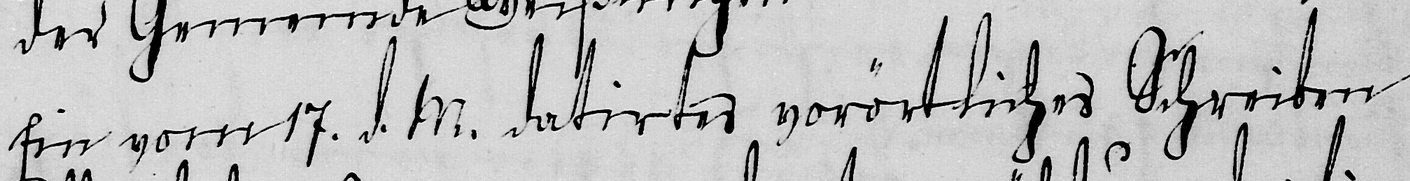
Ein vom 17. d. M. datirtes vorörtliches Schreiben
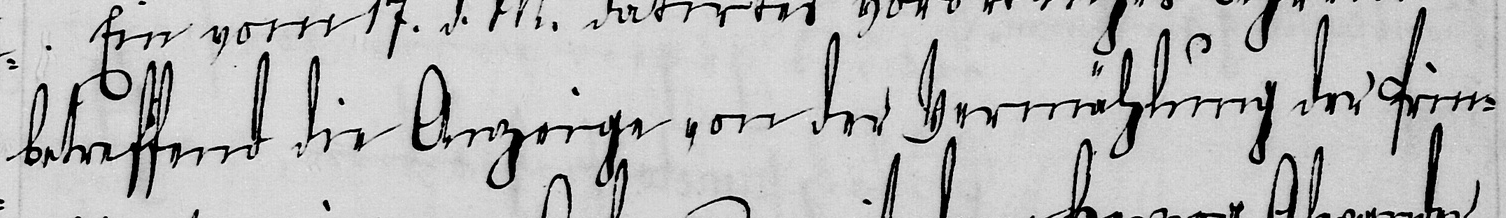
betreffend die Anzeige von der Vermählung der Prin¬
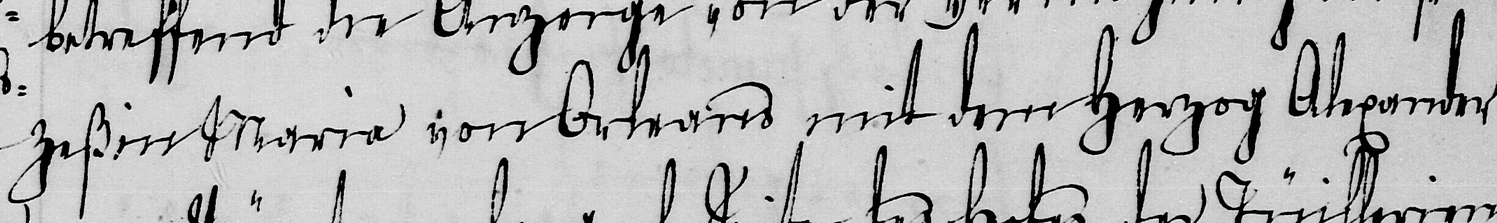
zeßin Maria von Orleans mit dem Herzog Alexander
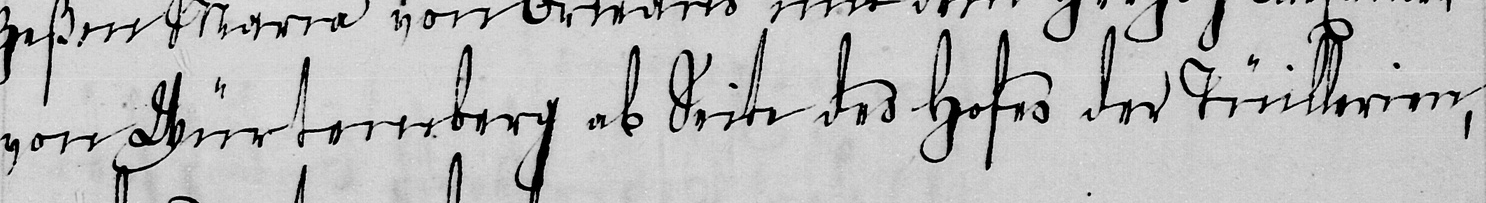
von Würtemberg ab Seite des Hofes der Tüillerien,
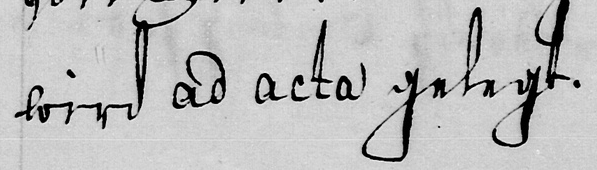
wird ad acta gelegt.
